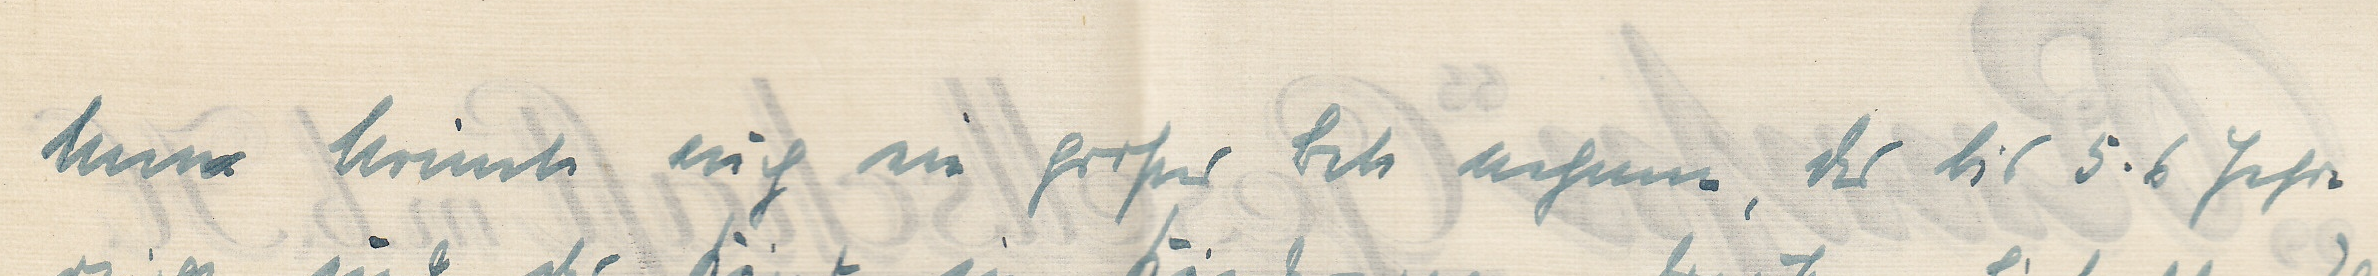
nn Emnt.a7 nn e.t b nht ri 3 6.Jer
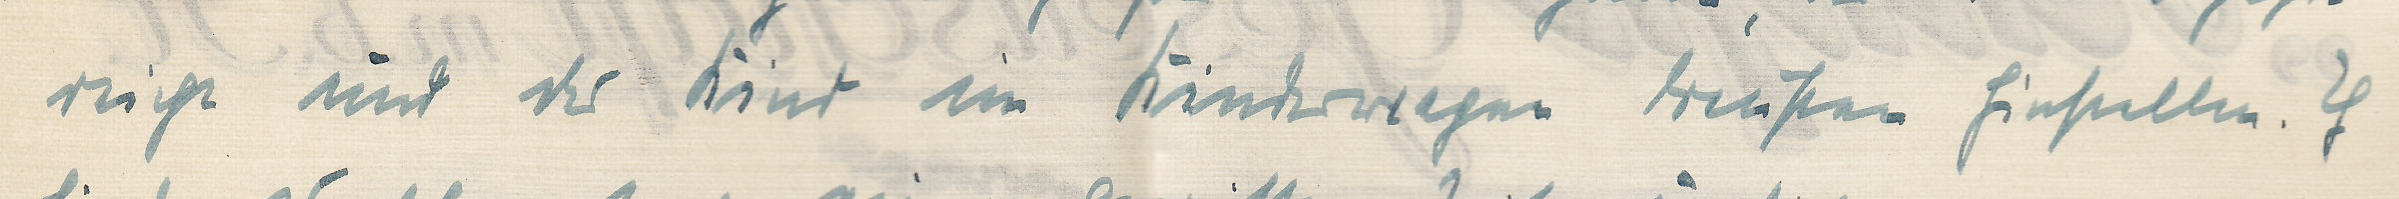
1i ch. und das Kind im Kinderwagen ?? sichselber. Ich
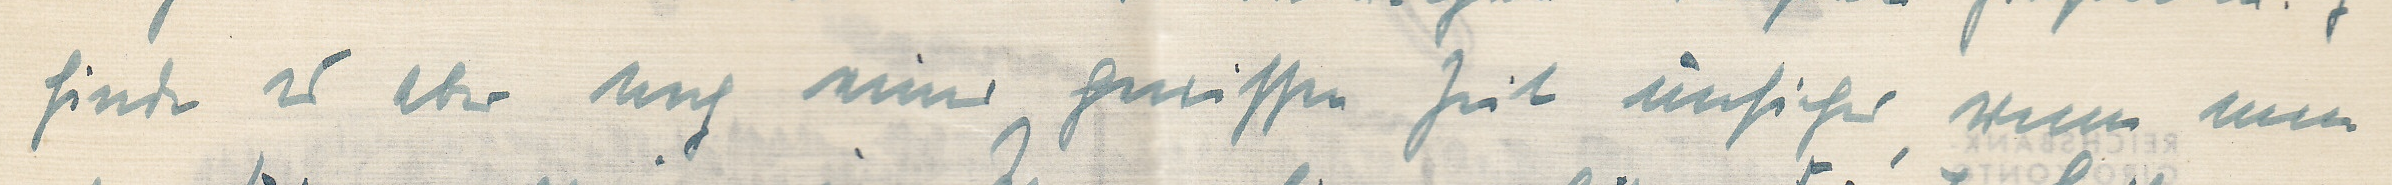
finde es ? uns reinen Gewissen si. hort linstohe nn, om
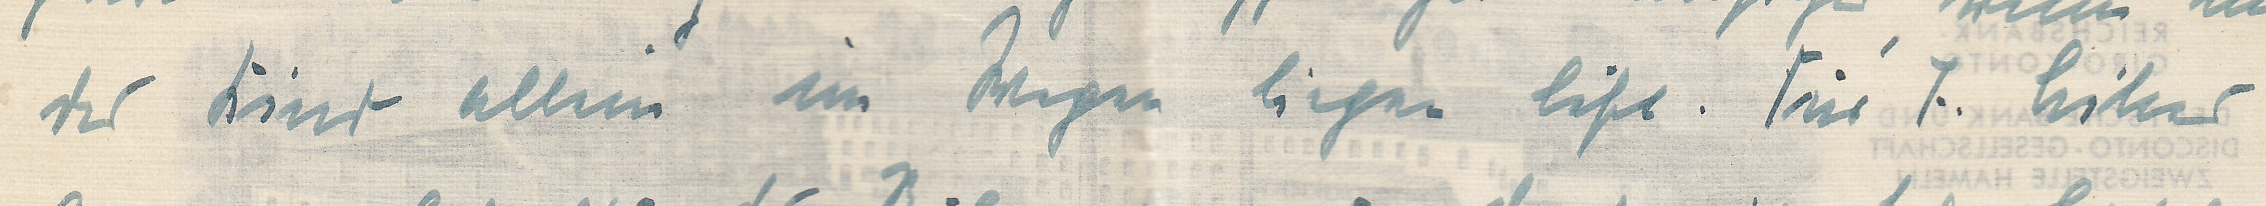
te Sincd ten dtvm Kesienr e. Echs ir . Soteso
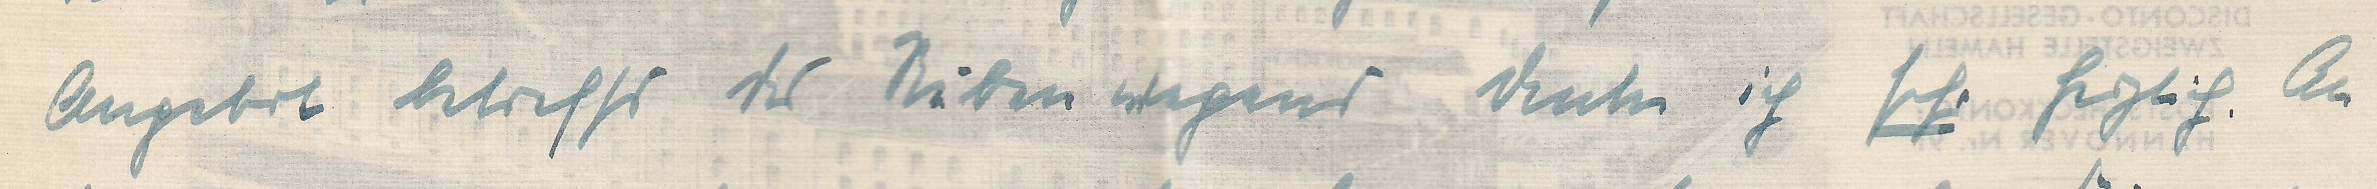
meim Ehap Mr dstewBmtnts.ntrga9 E. grt.
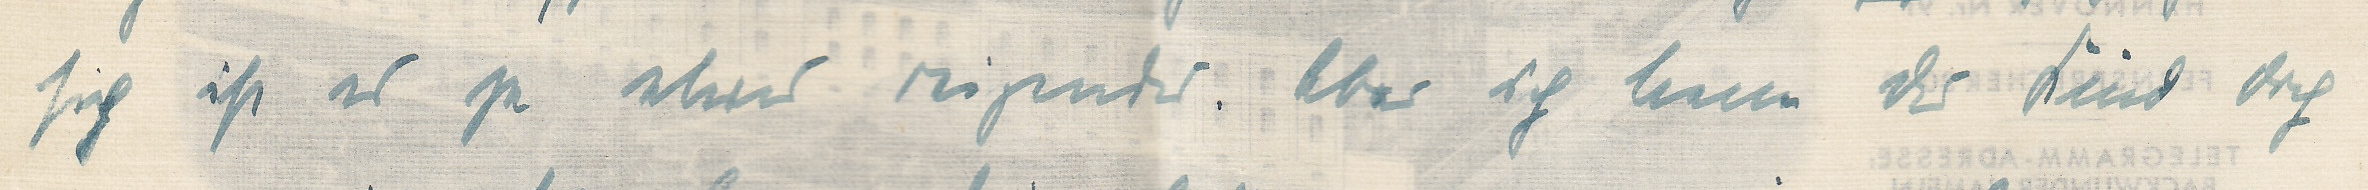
s Pri srtee. eesDi einde tei m d ieh648
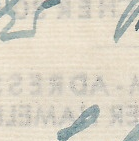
invs
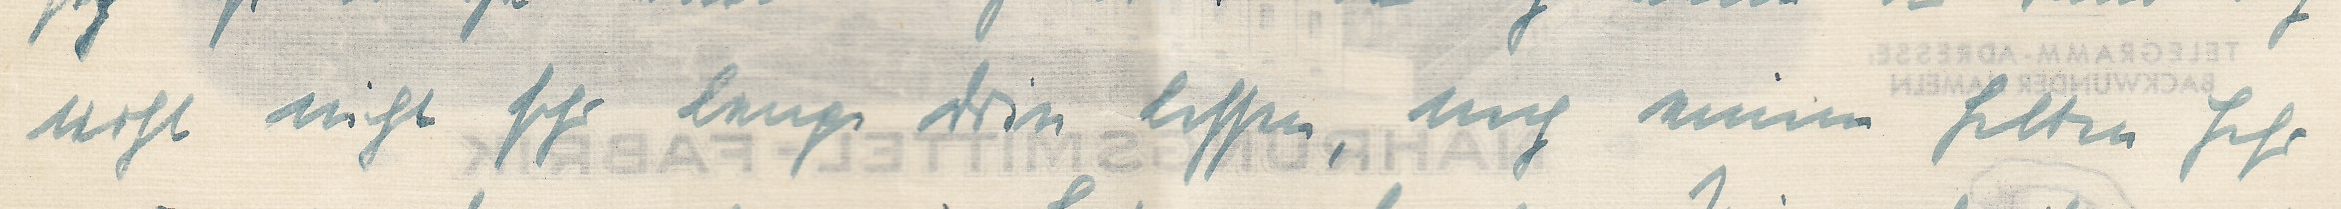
et ner Et Lreisr Me. es. mlin Esr.
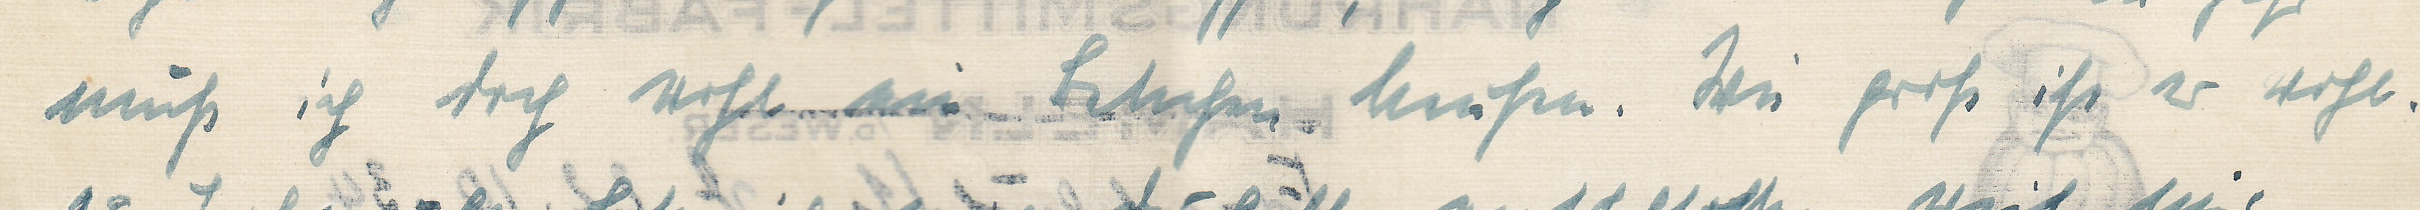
nis tot StrwireErteßerers.. i srost ioster tg.
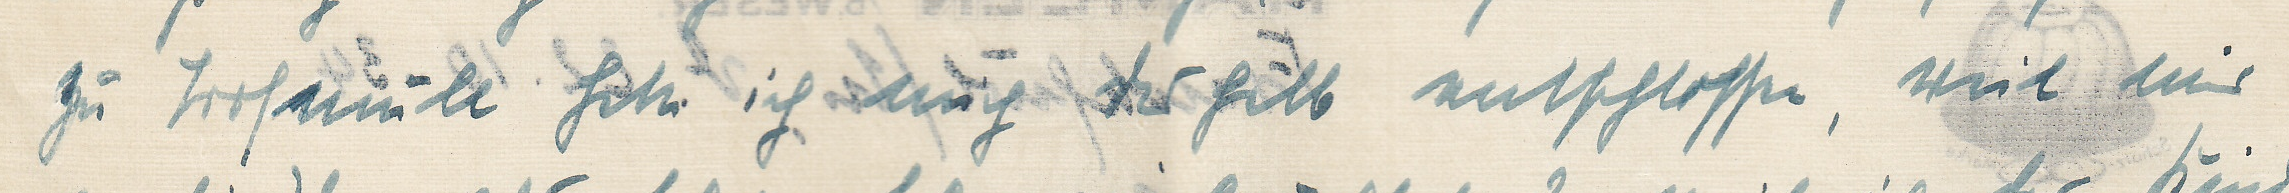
u rsdri htn 1 De tt ensschro sen Sibkrzcfubn¬
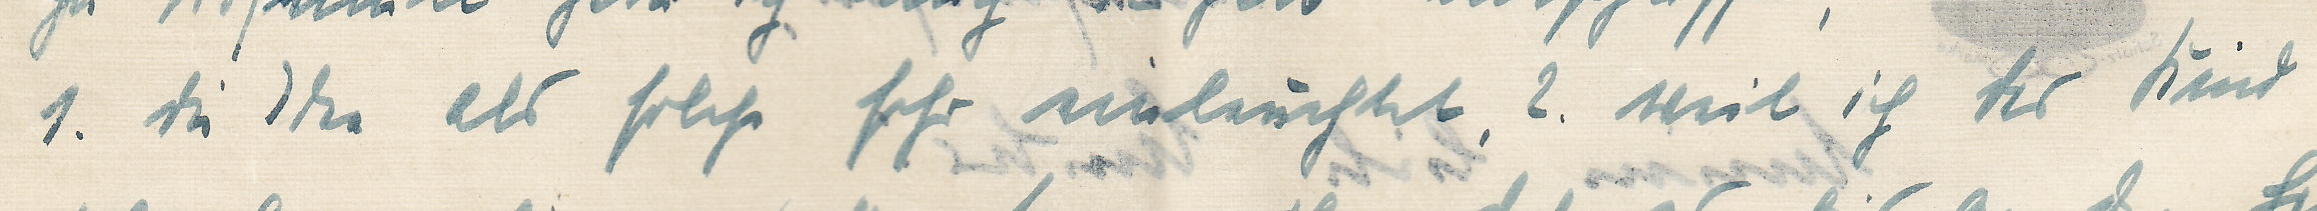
1. 1. . 2 selh si artufte, it. ero ie
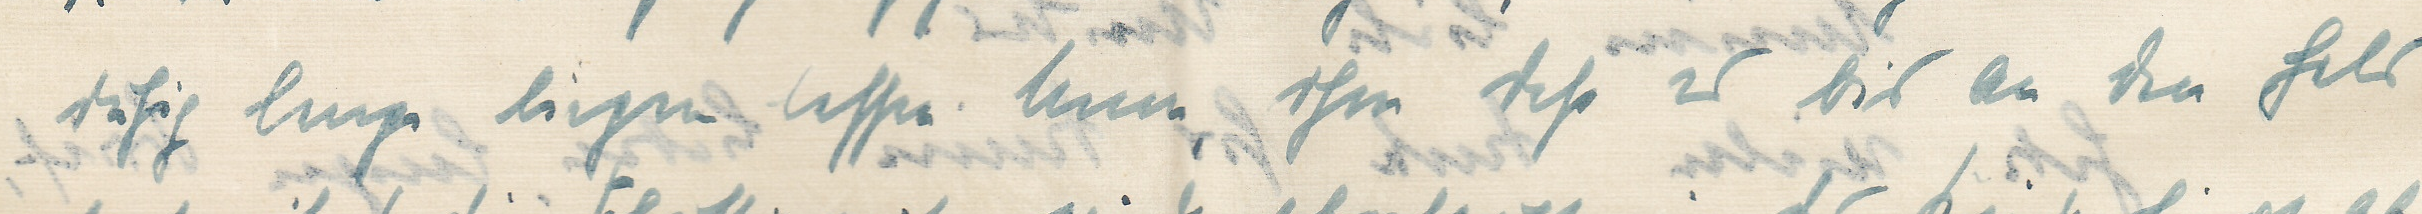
h leg¬iere ise tüze I ia . nr t.
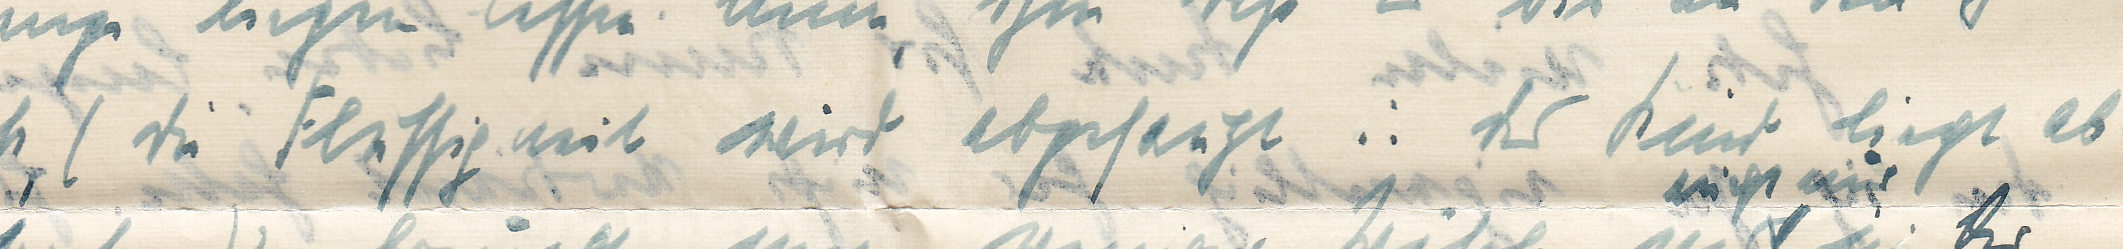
2bir.ro¬ mit 1m d . 1 En .
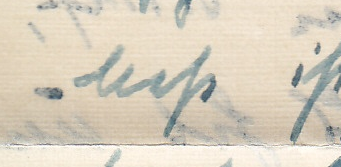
D1.4
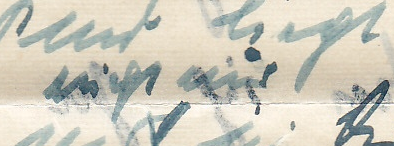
age wie
